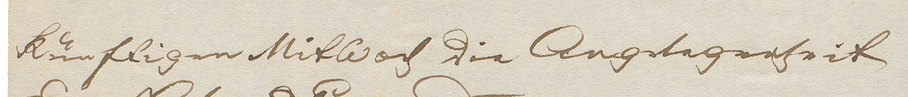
künftigen Mitwoch die Angelegenheit
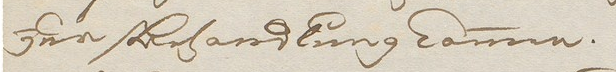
zur Behandlung kommen.
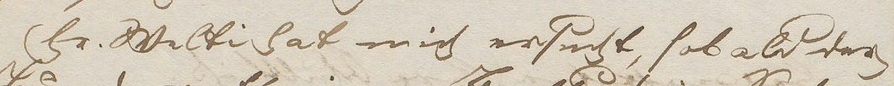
Hr. Welti hat mich ersucht, sobald der
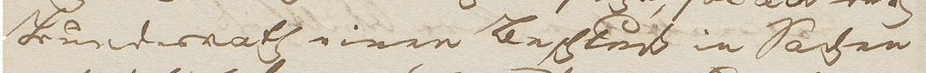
Bundesrath einen Beschluß in Sachen
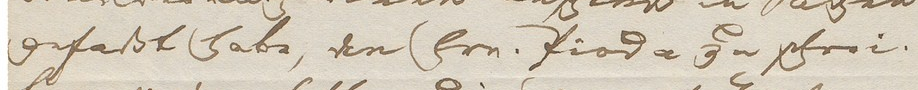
gefaßt habe, den Hrn. Pioda zu schrei-
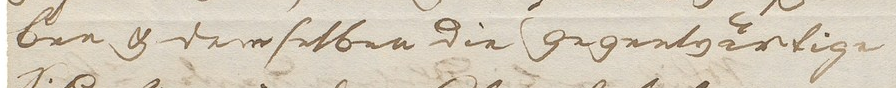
ben & demselben die gegenwärtige
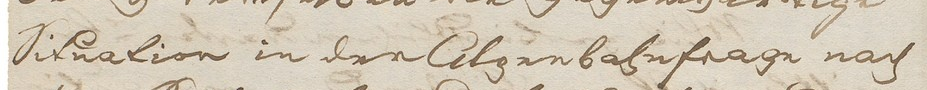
Situation in der Alpenbahnfrage nach
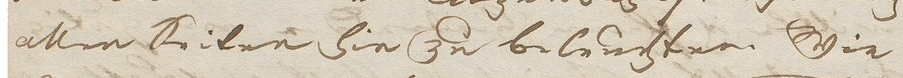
allen Seiten hin zu beleuchten. Wie
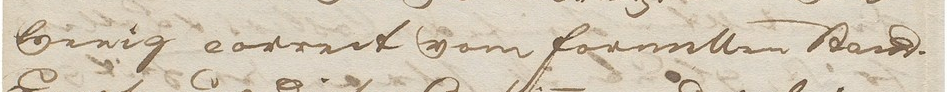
wenig correct vom formellen Stand-
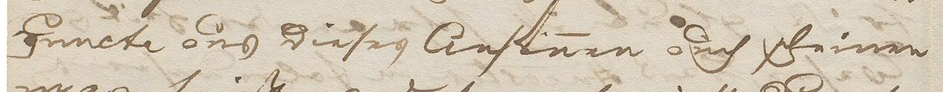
puncte aus dieses Ansinnen auch scheinen
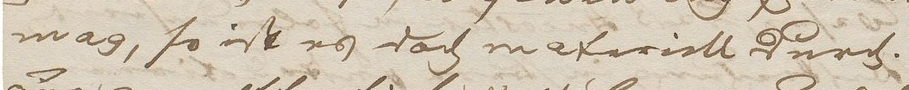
mag, so ist es doch materiell durch-
